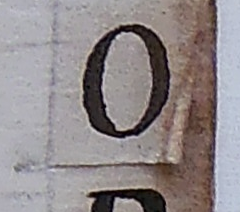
O
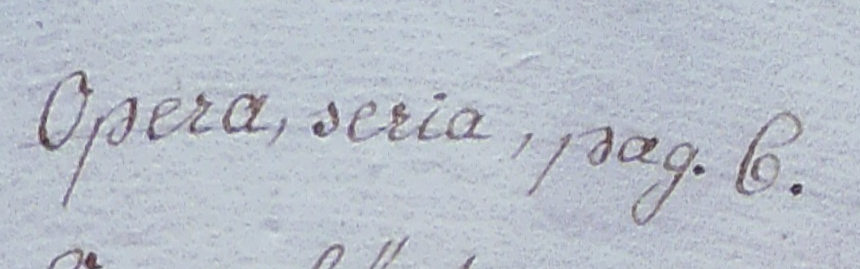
Opera, seria, pag. 6.
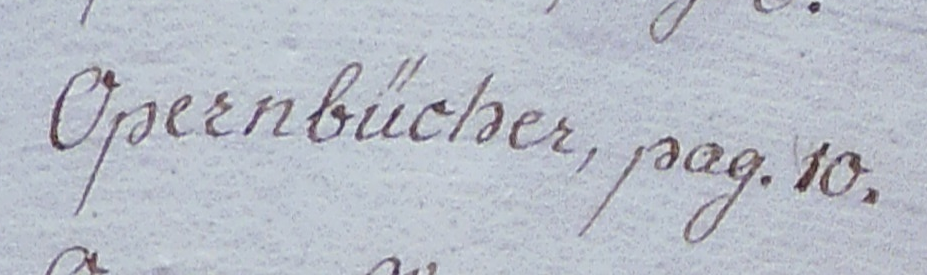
Opernbücher, pag. 10.
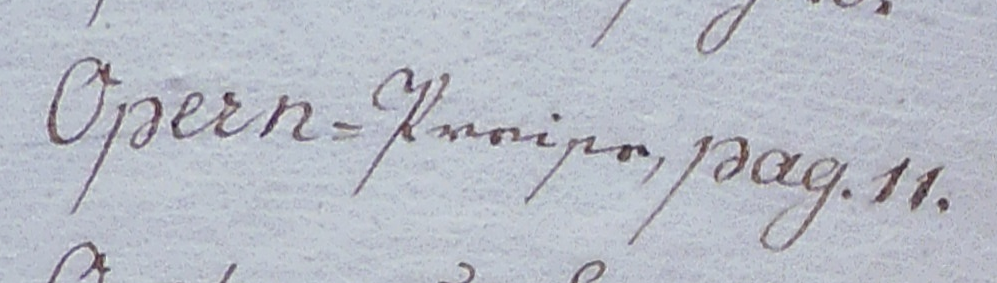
Opern=Preise, pag. 11.
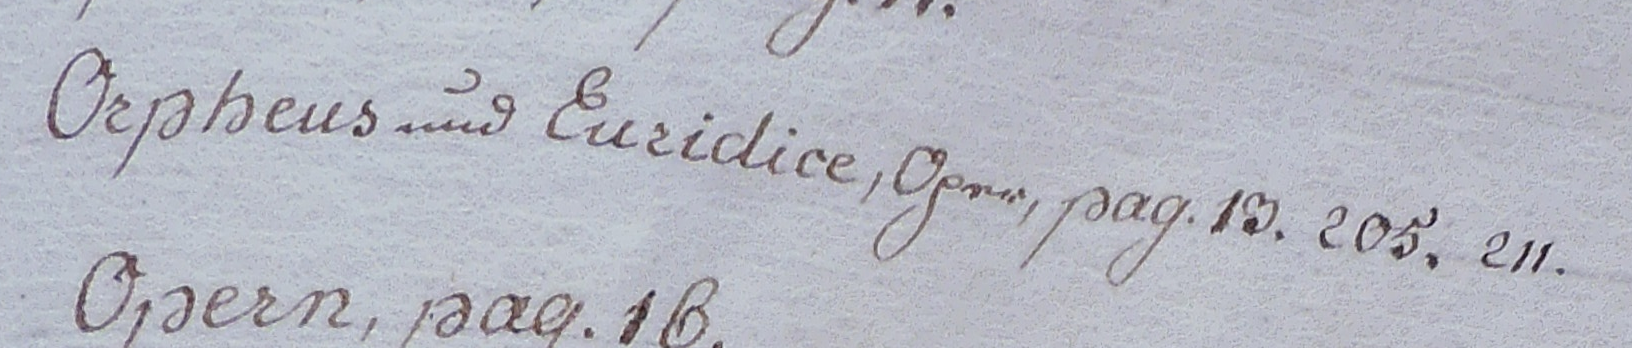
Orpheus und Euridice, Oper, pag. 13. 205. 211.
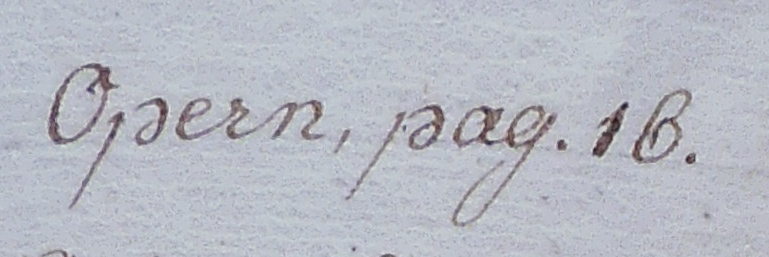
Opern, pag. 16.
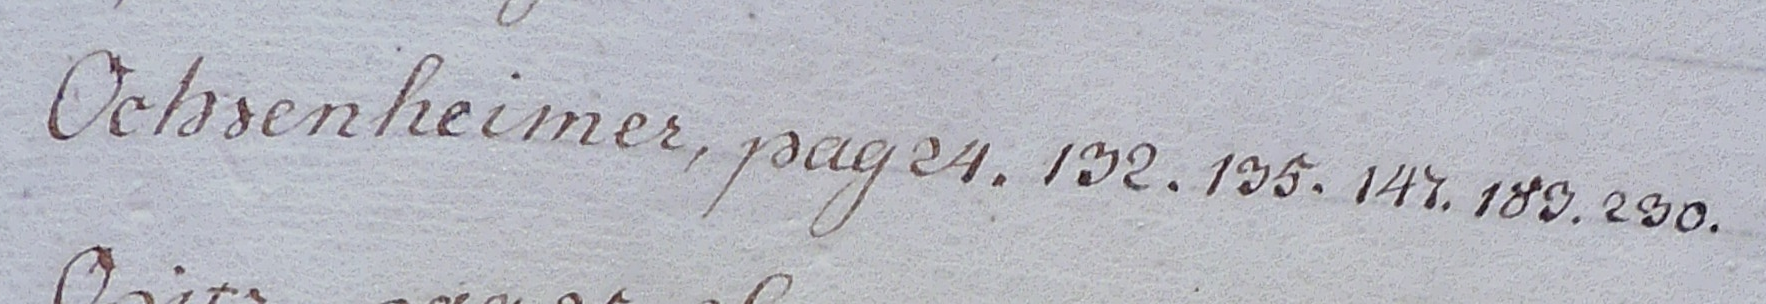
Ochsenheimer, pag 24. 132. 135. 147. 183. 230.
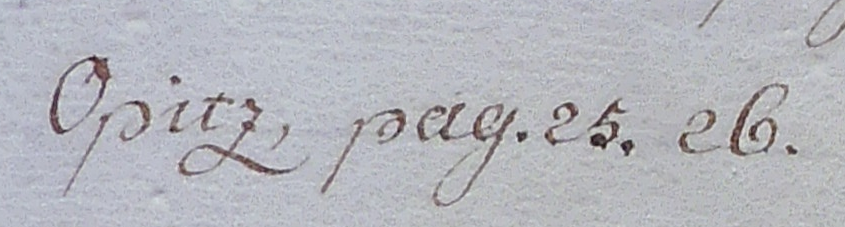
Opitz, pag. 25. 26.
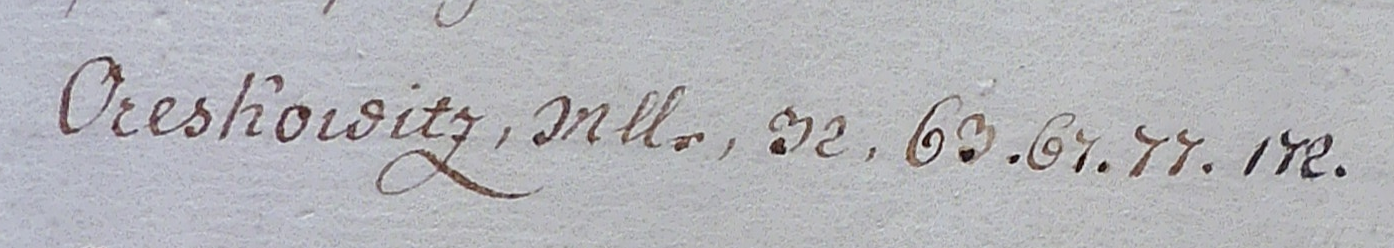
Oreskowitz, Mlle, 32. 63. 67. 77. 172.
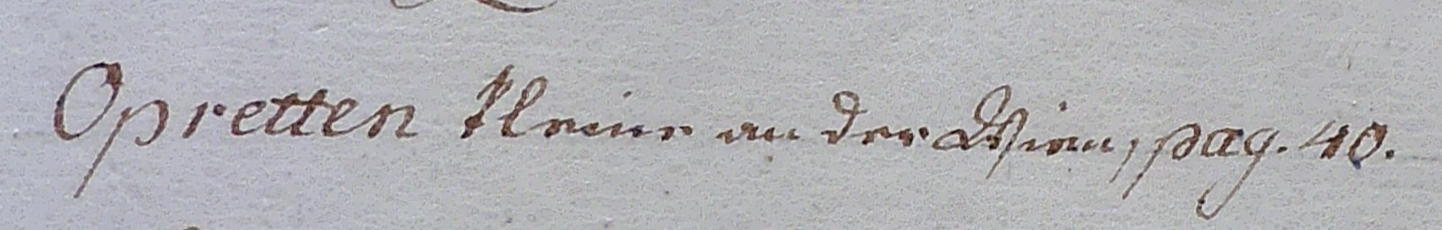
Opretten kleine an der Wien, pag. 40.
